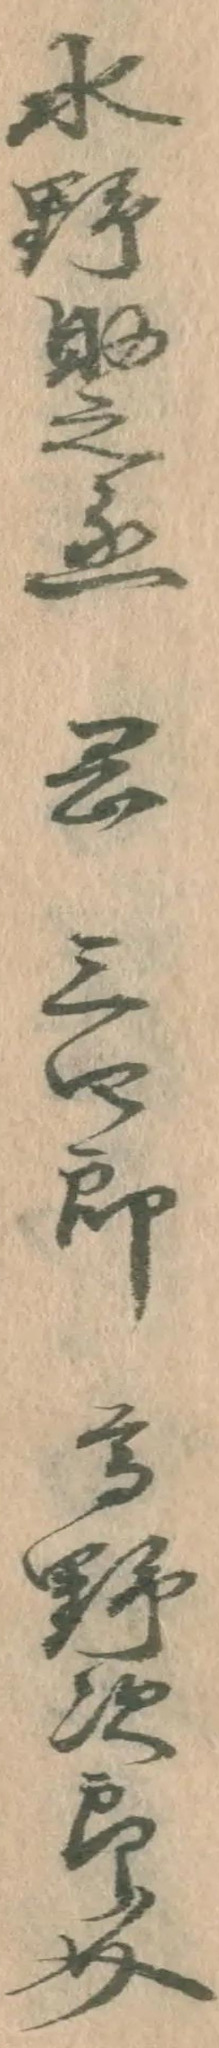水野助之丞岡三四郎高野次郎介
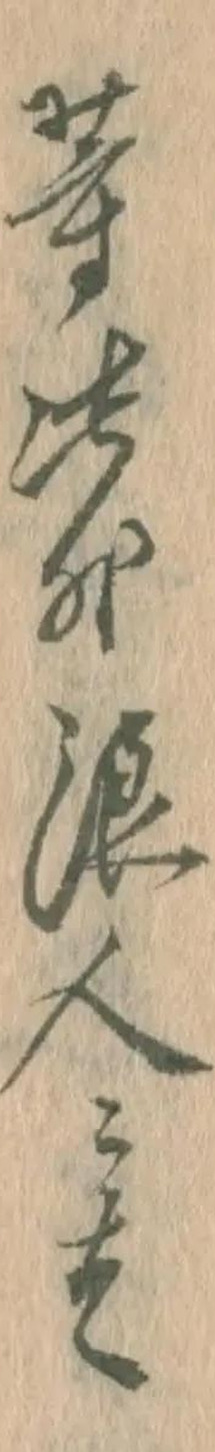等此外浪人に者
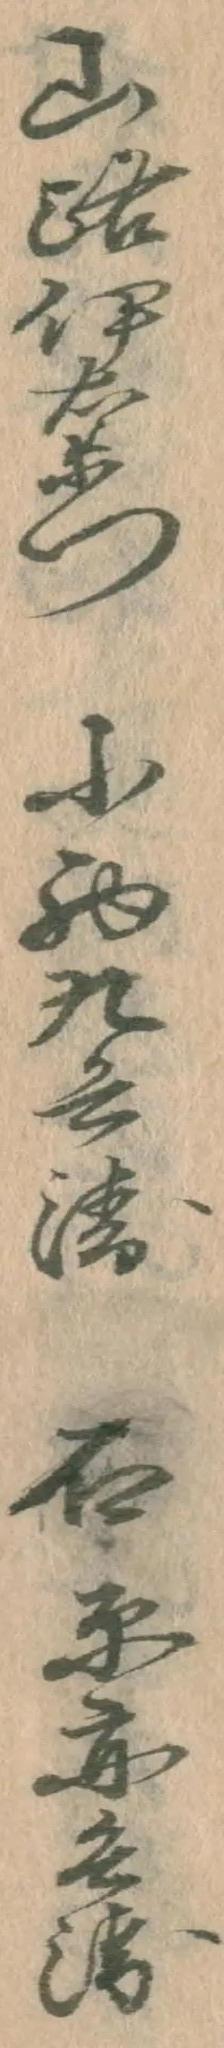山路伊右衛門小西九兵衛石原亦兵衛
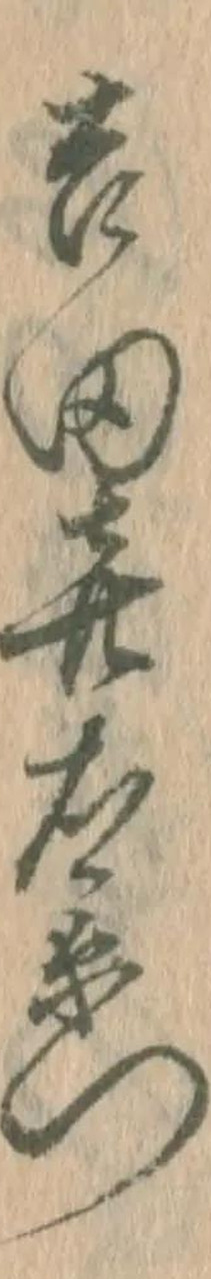吉田彦右衛門
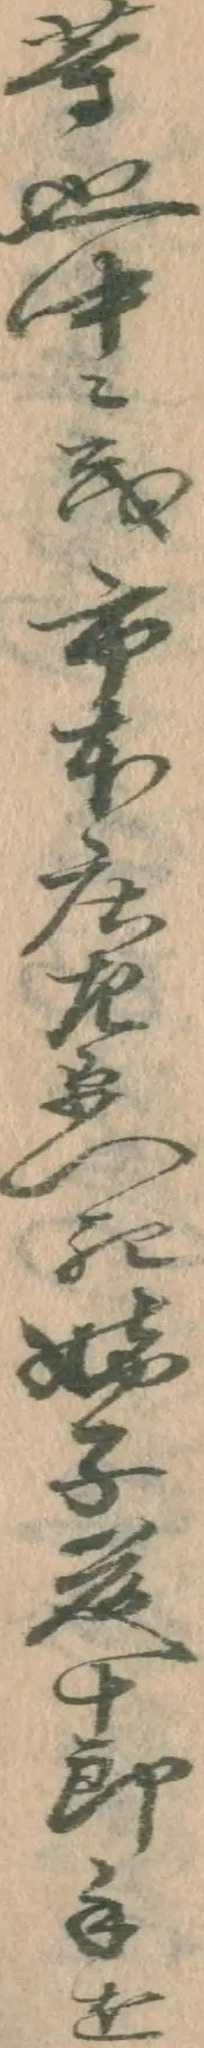等也中に茂市木庄左衛門歟嫡子藤十郎手を
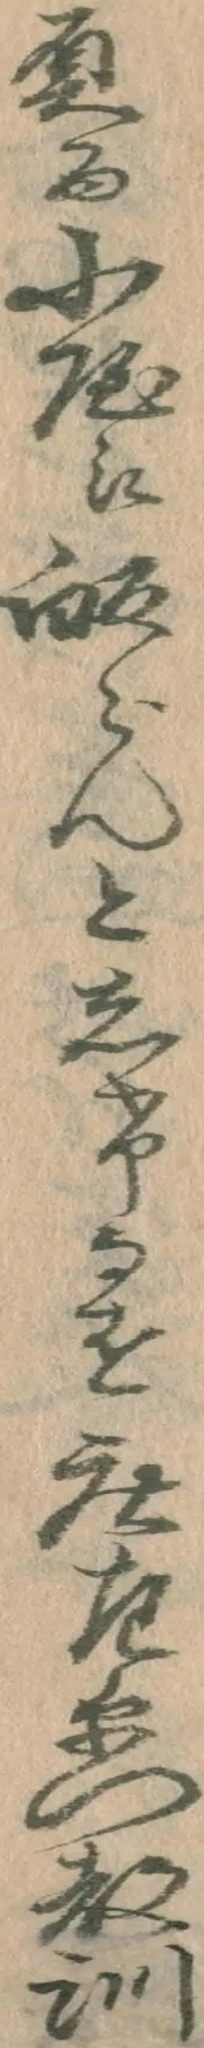負而小屋江皈らんと志希るを庄左衛門教訓
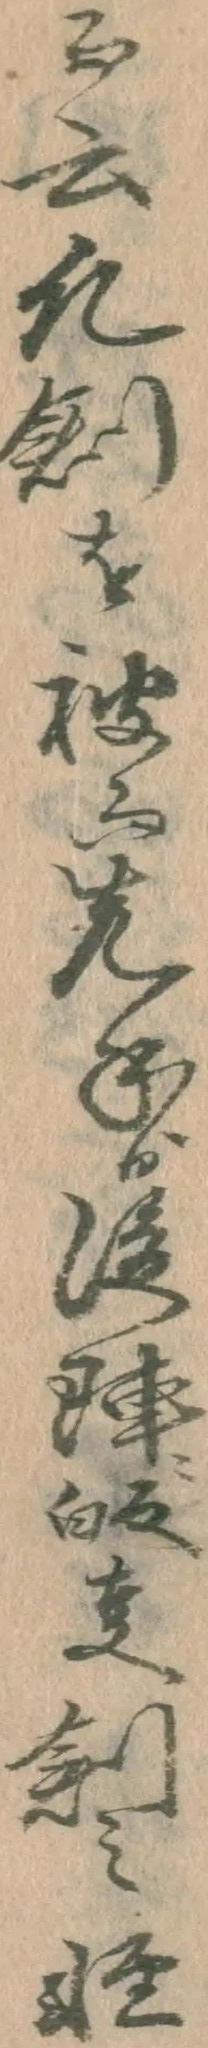而云凡創を被而先手ゟ後陣皈事創之軽
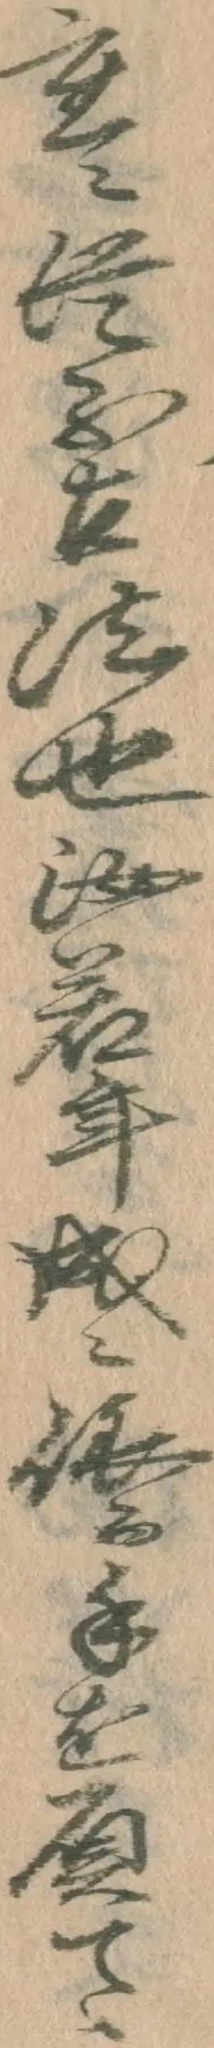重に従ふ古法也汝若年成に依而手を負ても
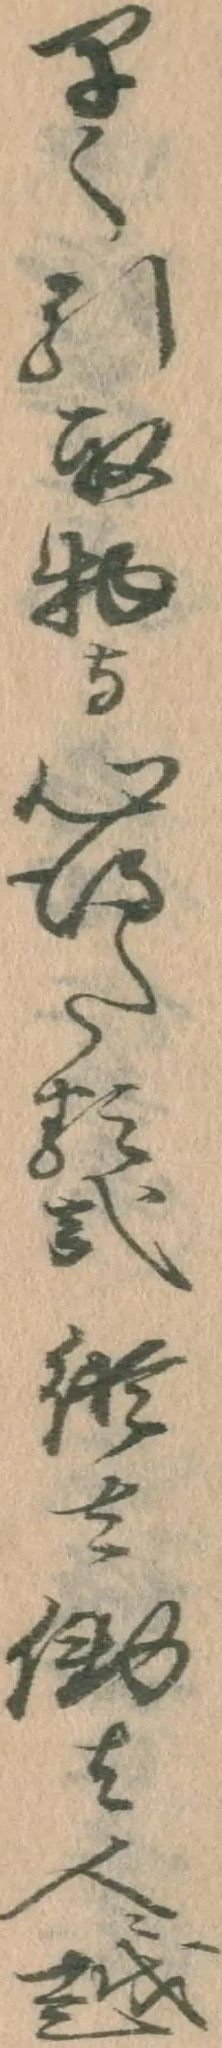早く引取物与心得た類哉併者働者人に越
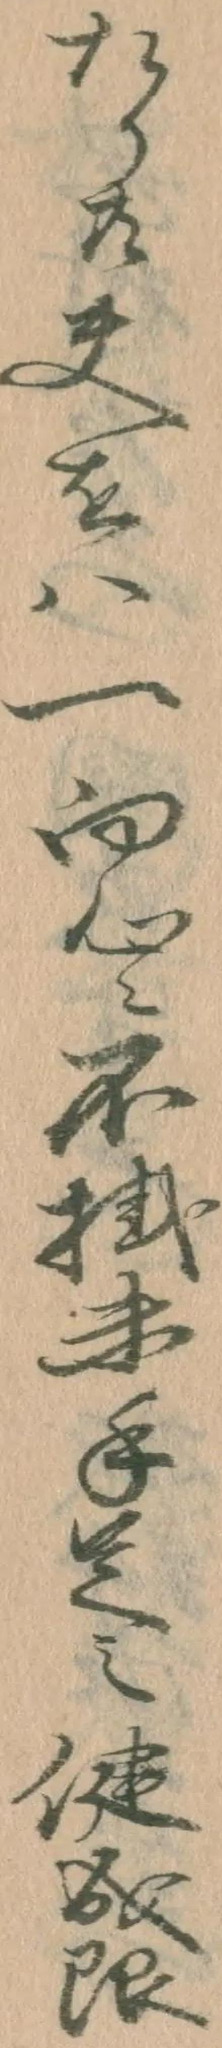たり共夫をは一向心に不掛未手足之健成限
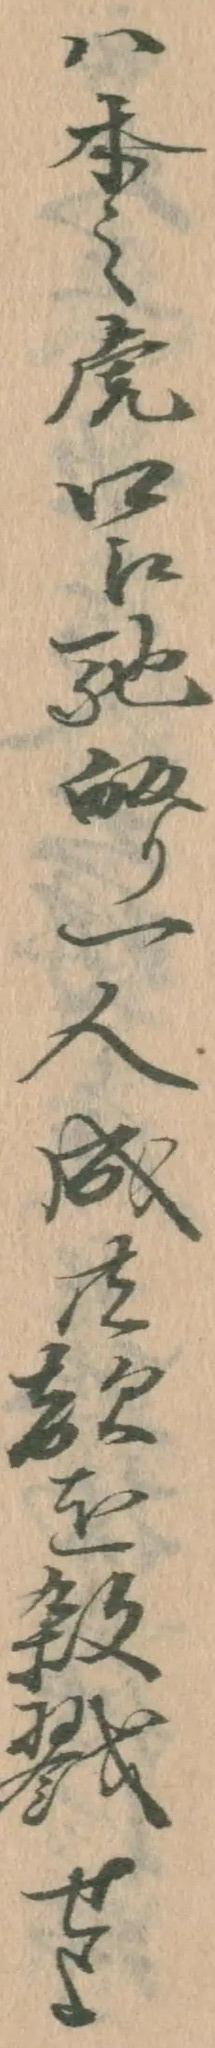は本之虎口江馳皈り一人成共敵を殺戮せよ
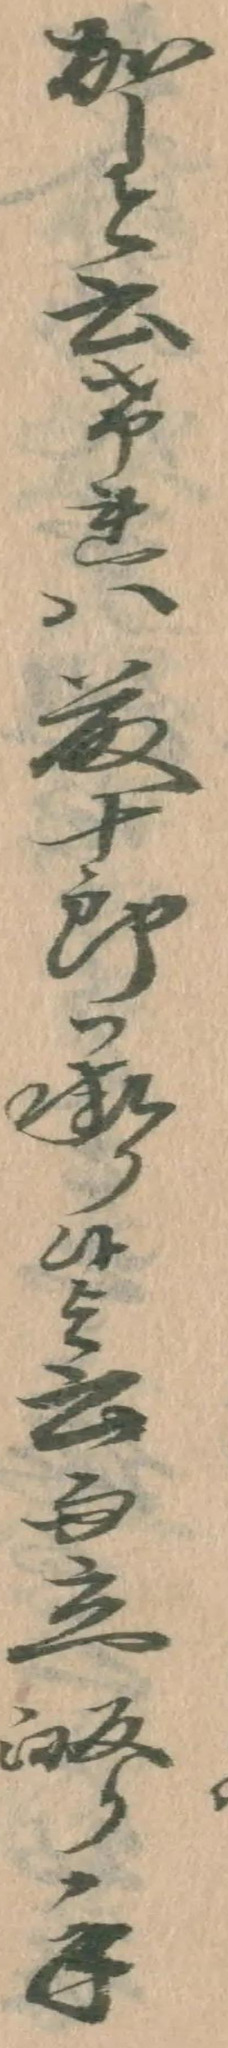加しと云希連は藤十郎承り候与云而立皈り手
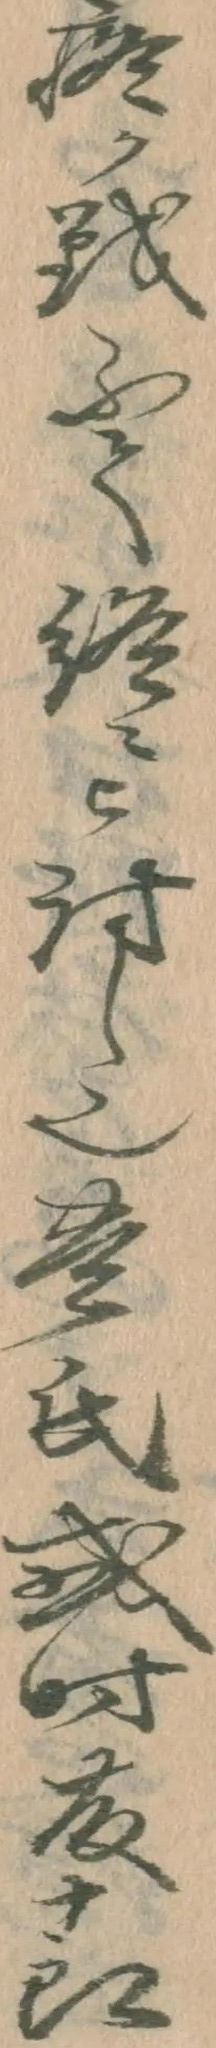疼く戦ふて終に被討し也豊氏或時藤十郎
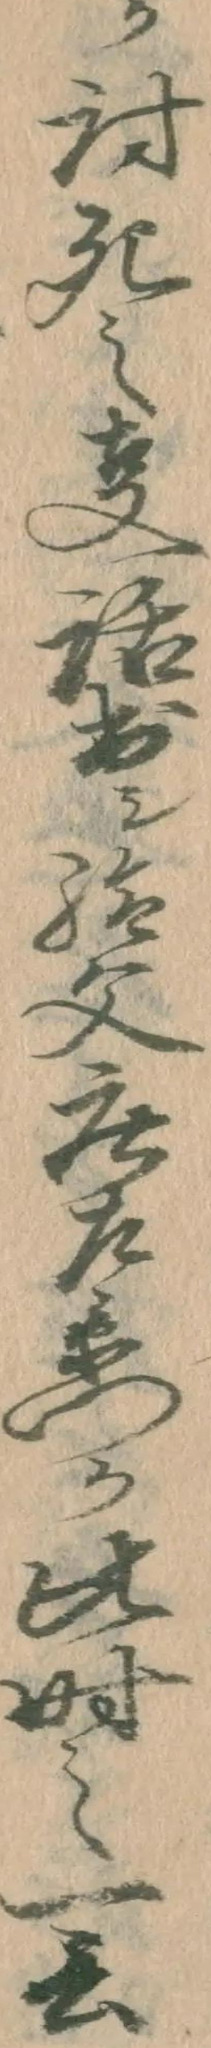か討死之事話出し給父庄左衛門か此時之一言
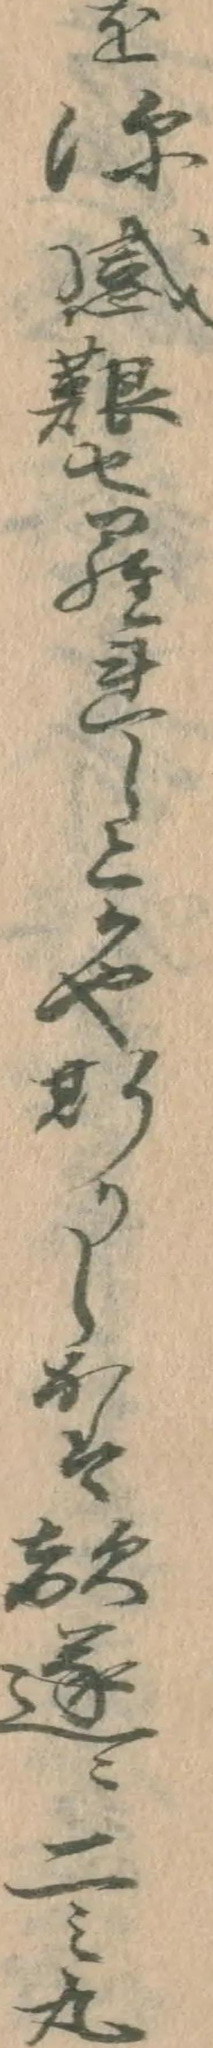を深感艱せ羅連しとかや斯りしかは敵遂に二之丸
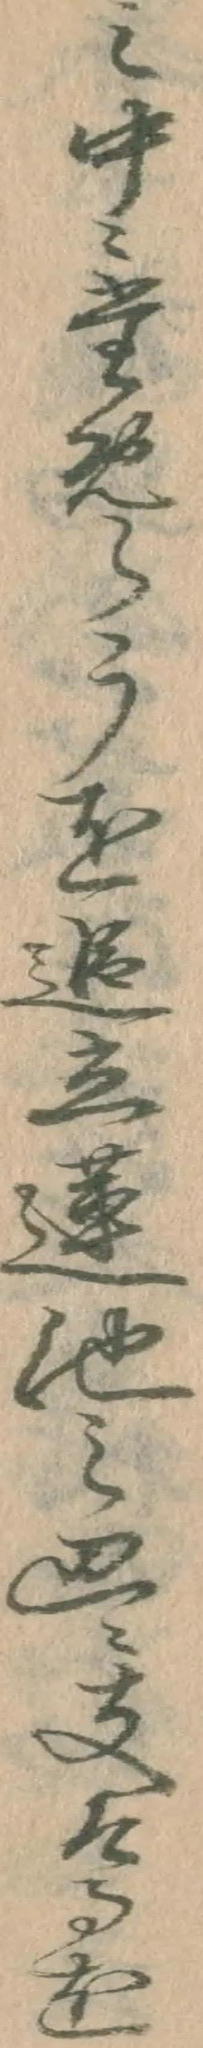之中に堂免らうを追立蓮池之辺に支たるを
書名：切支丹御退治記 49巻. [8]
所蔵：国立国会図書館 National Diet Library, JAPAN
